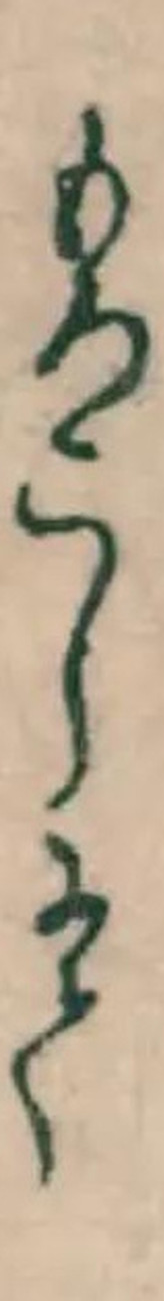もろこしにて
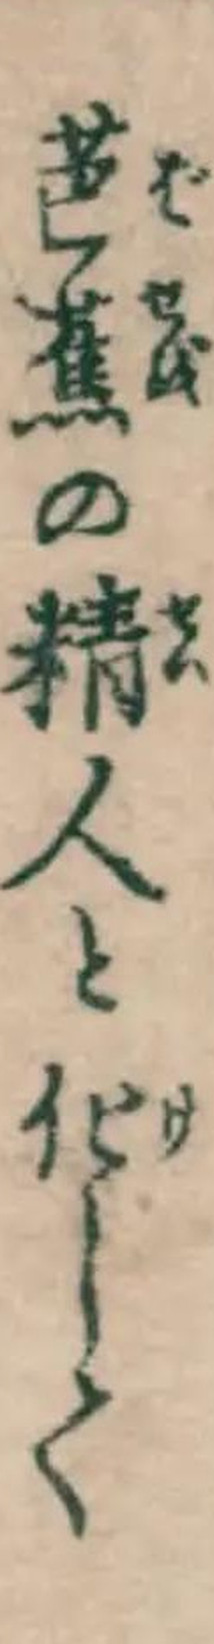芭蕉の精人と化して
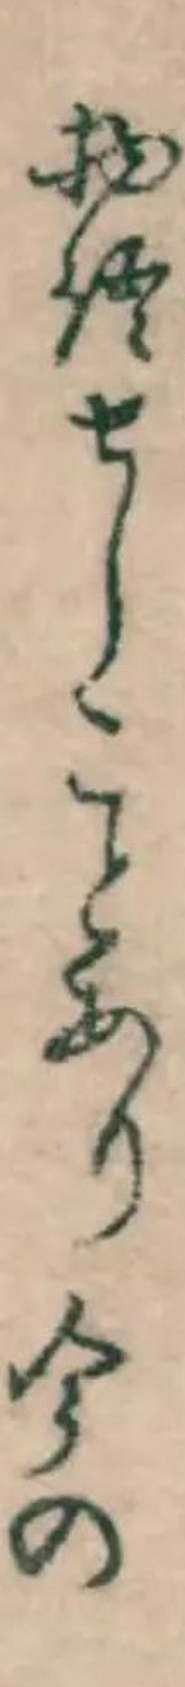物語せしことあり今の
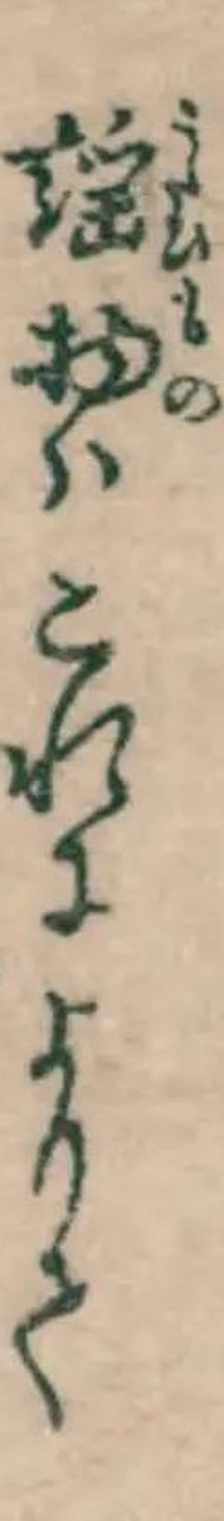謡物はこれによりて
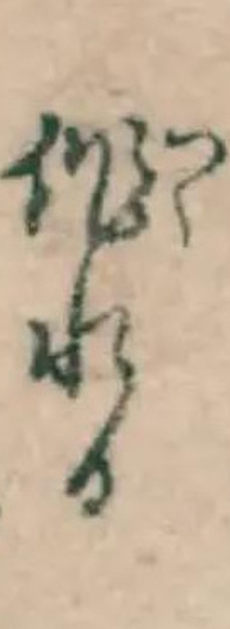作れる
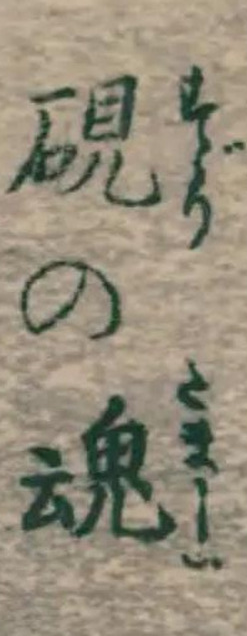硯の魂
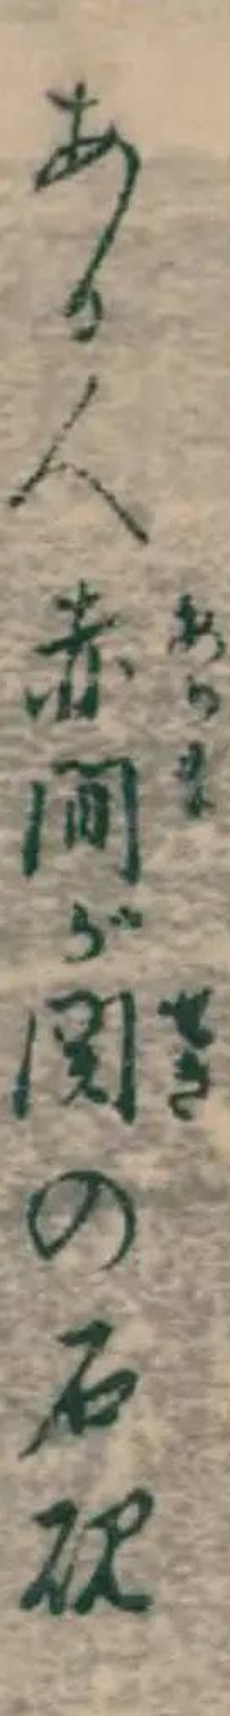ある人赤間が関の石硯
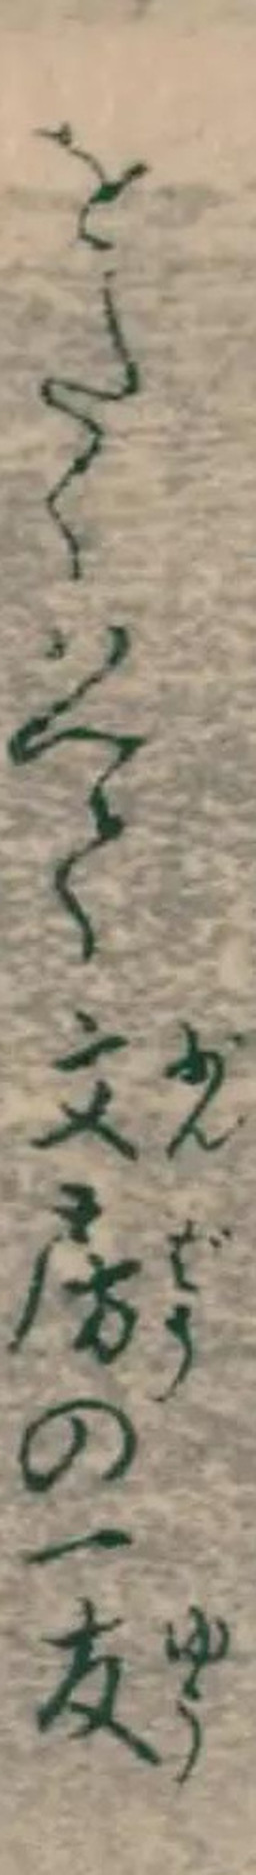をたくはへて文房の一友
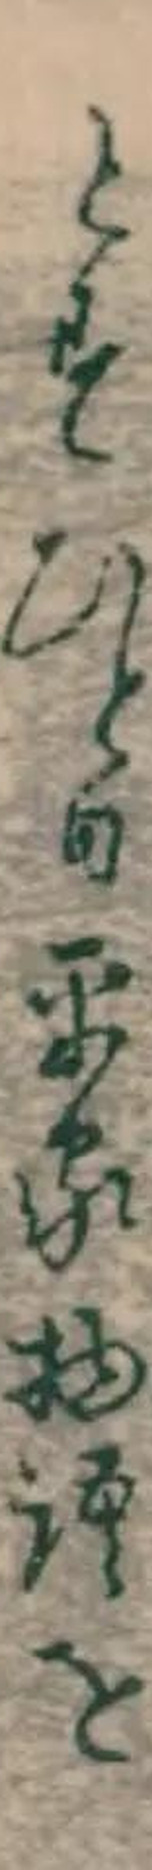とすひと日平家物語を
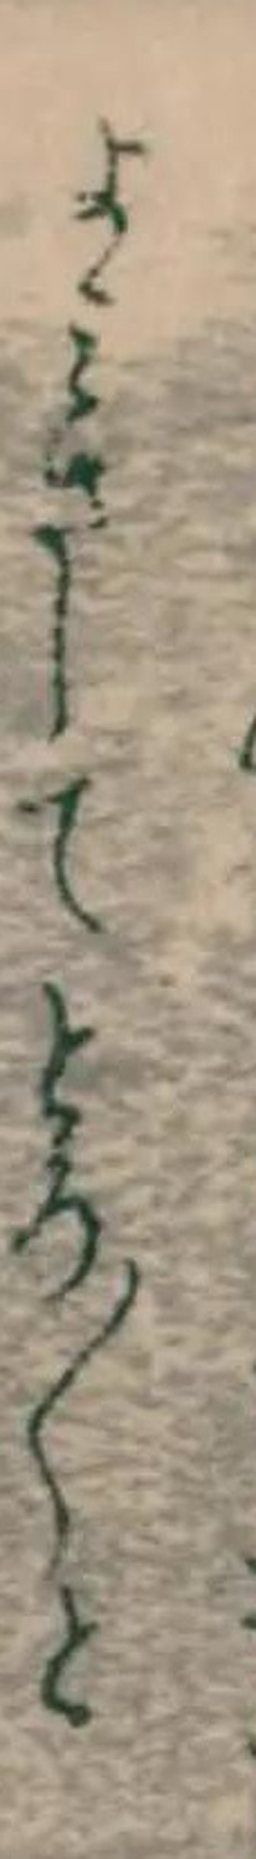よみさしてとろ〳〵と
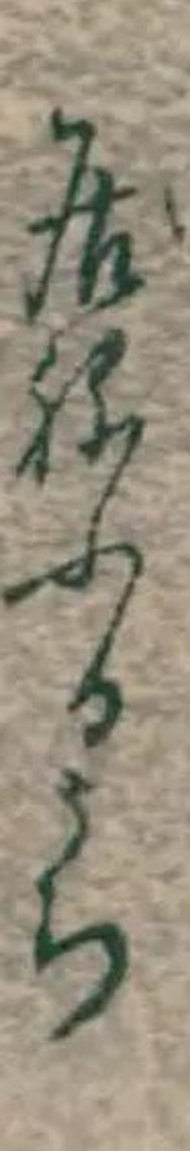居ねふるうち
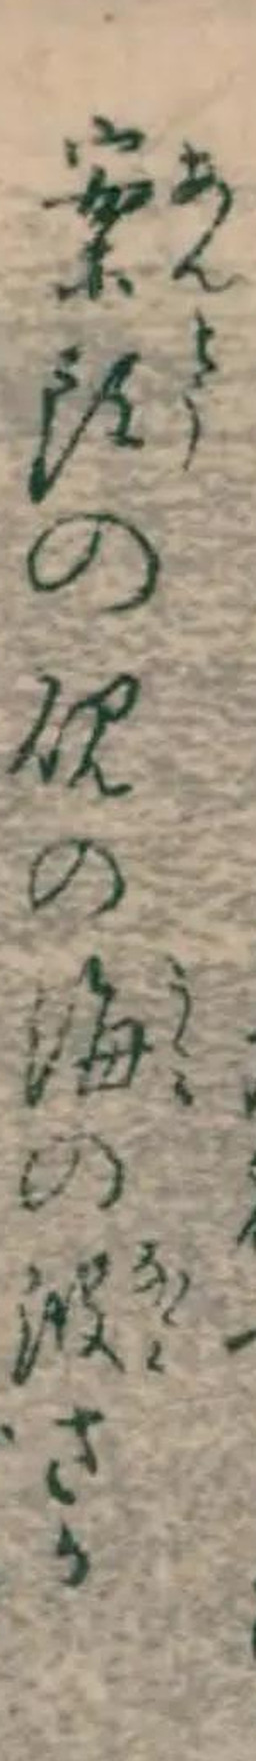案頭の硯の海の波さか
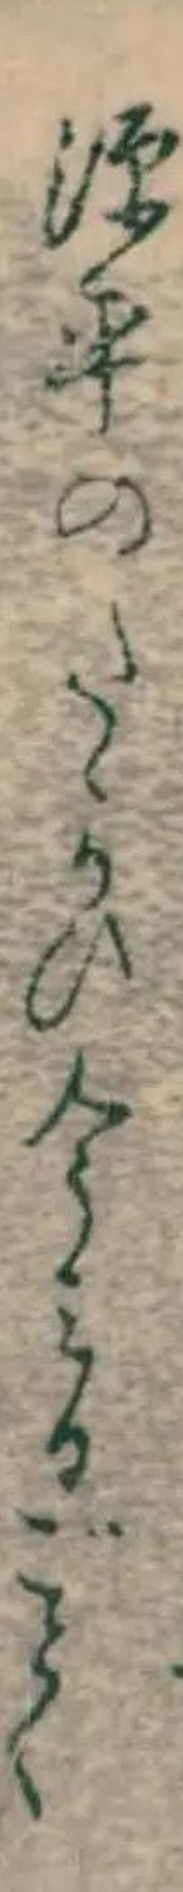源平のたゝかひ今みるごとく
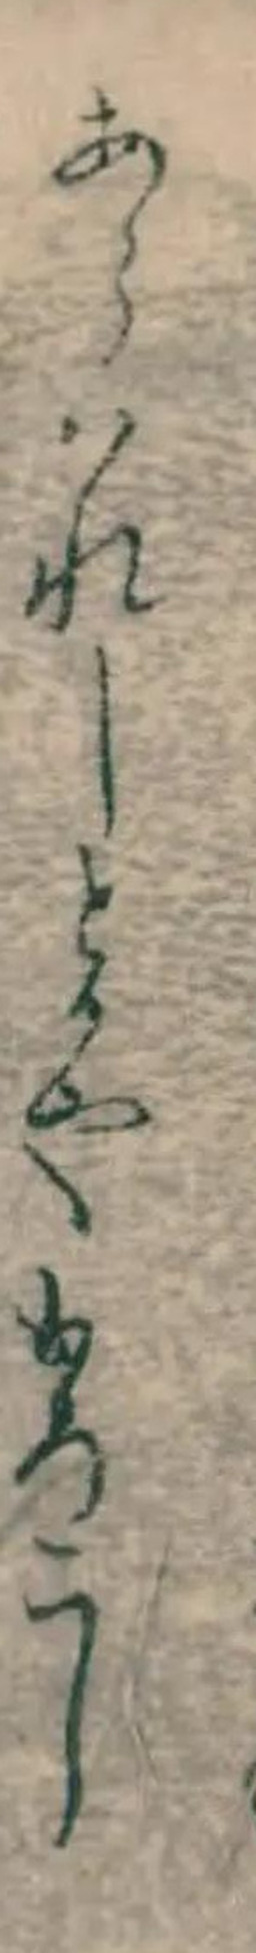あらはれしとかやもろこし
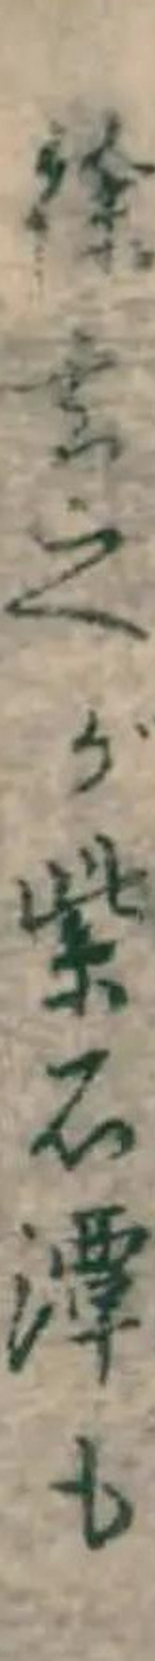徐玄之が紫石潭も
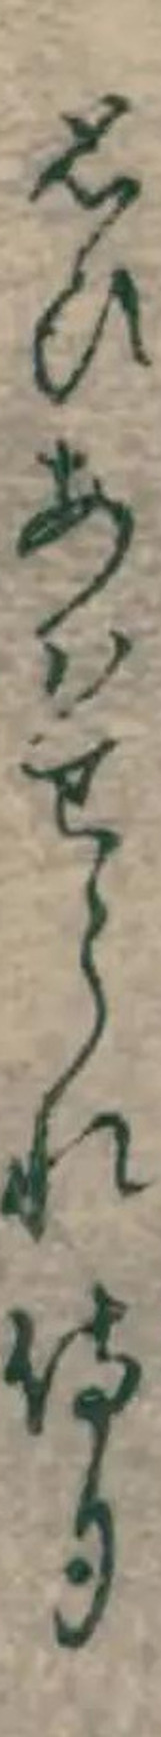思ひあはせられ侍り
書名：百鬼夜行 3巻拾遺3巻. [2]
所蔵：国立国会図書館 National Diet Library, JAPAN
